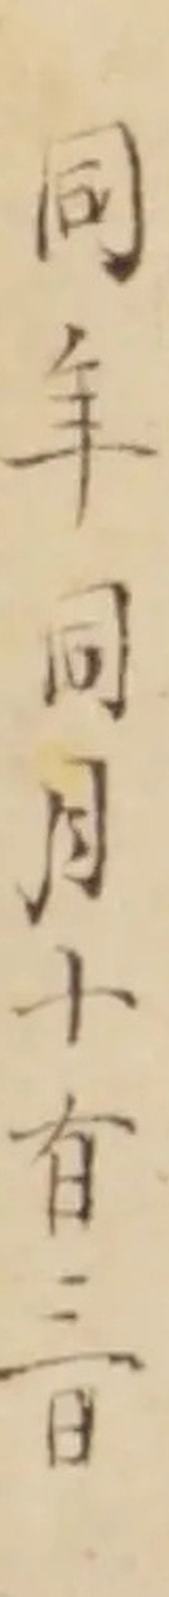同年同月十有三日
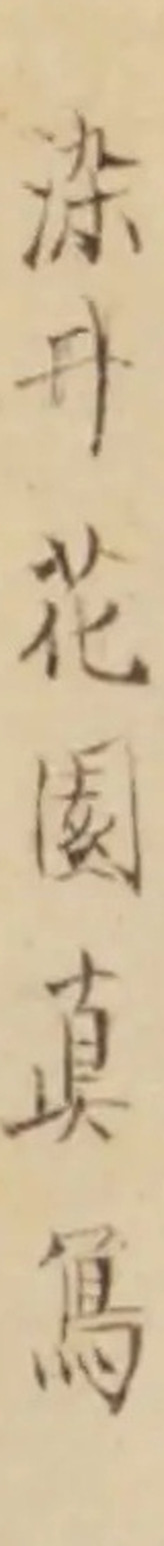染井花園真写

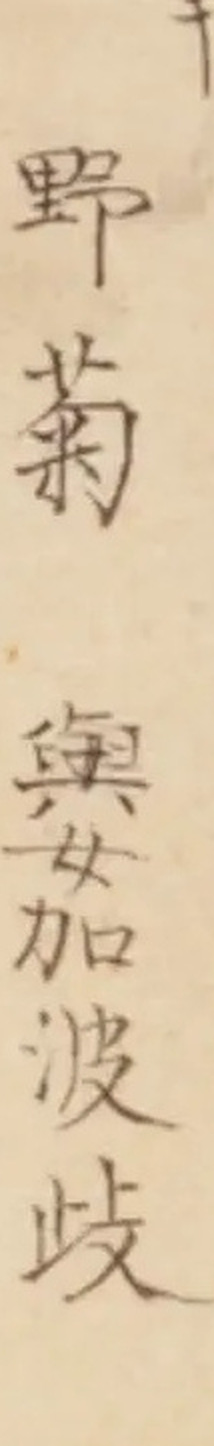野菊与女加波歧
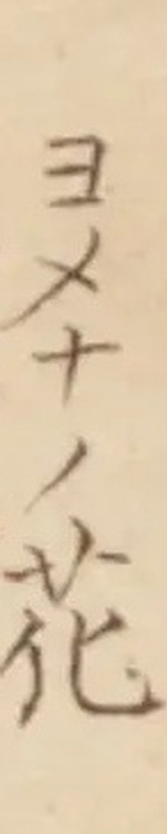ヨメナノ花
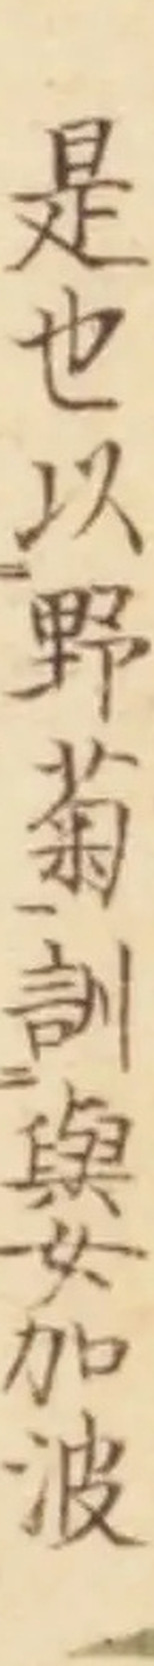是也以野菊訓与女加波
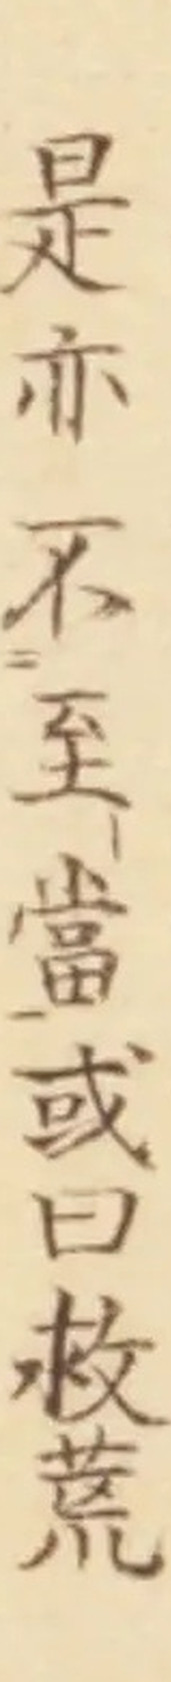是亦不至-当或曰救荒
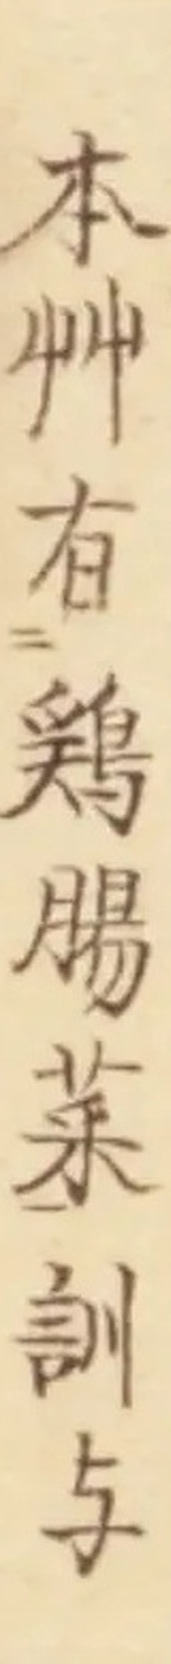本艸有鶏腸菜訓与
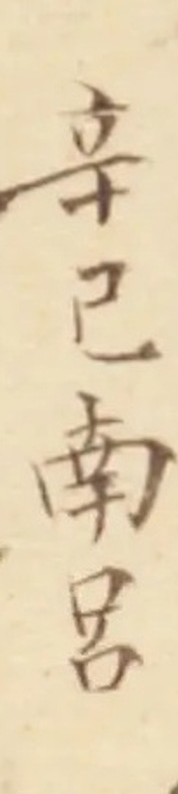辛巳南呂
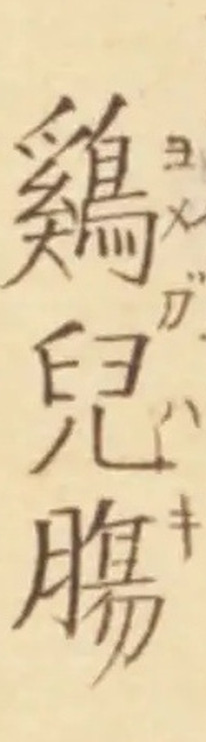鶏児腸
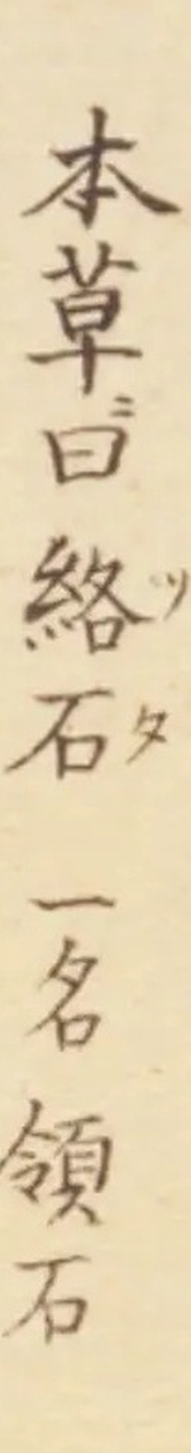本草曰絡石一名領石
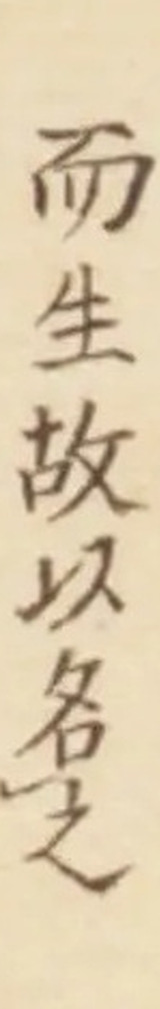而生故以名之
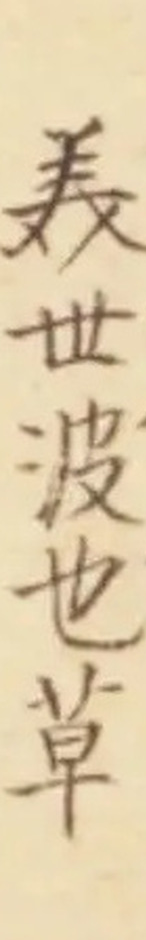美世波也草
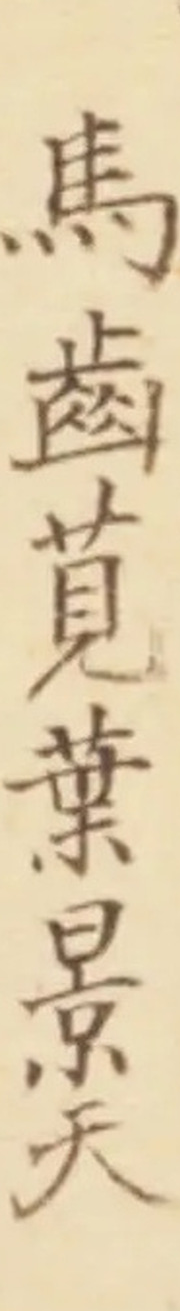馬歯莧葉景天
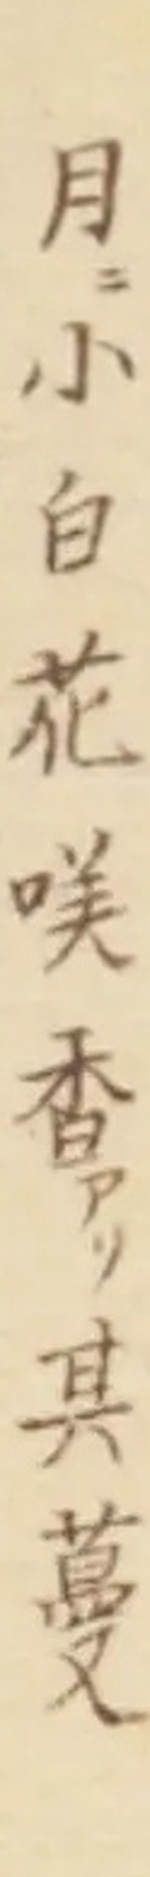月小白花咲香其蔓
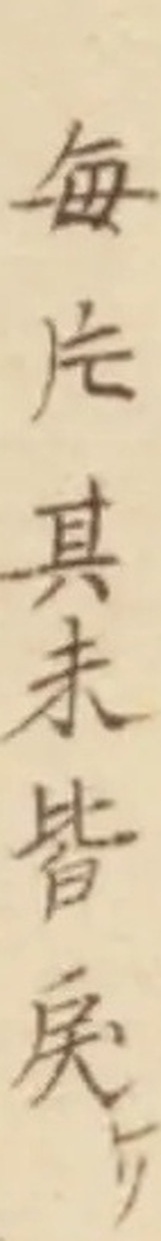毎片其未皆戻

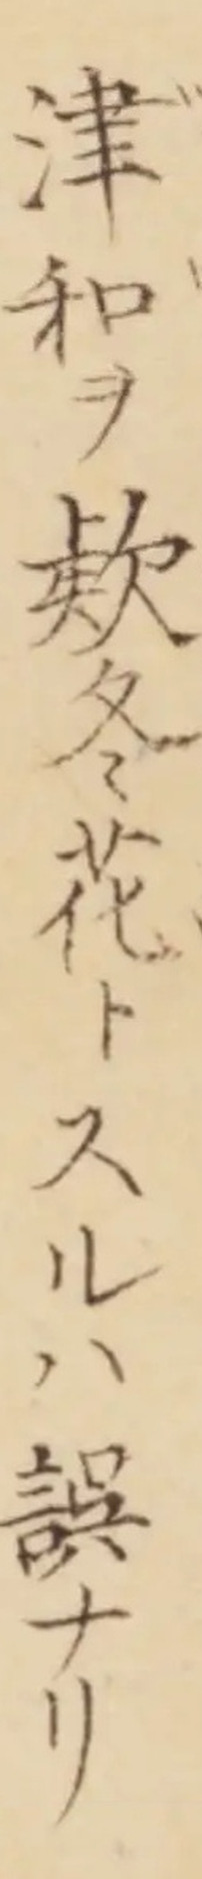津和ヲ款冬花スルハ誤ナリ
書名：梅園草木花譜秋之部. 1
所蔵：国立国会図書館 National Diet Library, JAPAN
